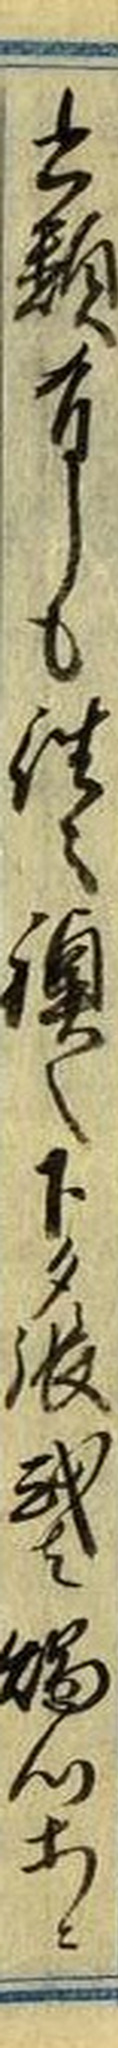書類有しも往々襖之下た張或は燭心等に
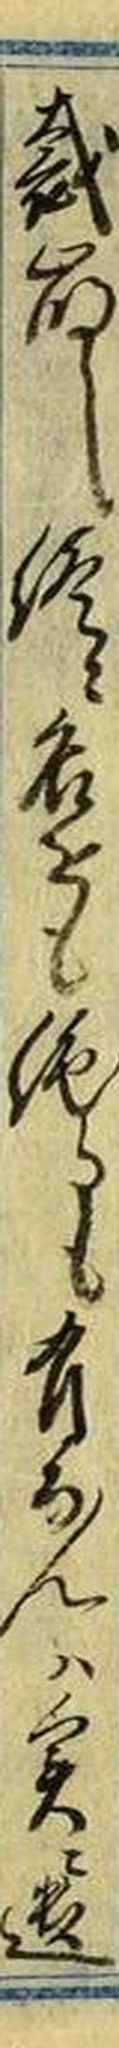裁崩し終に名をも絶るも有なんは実に遺
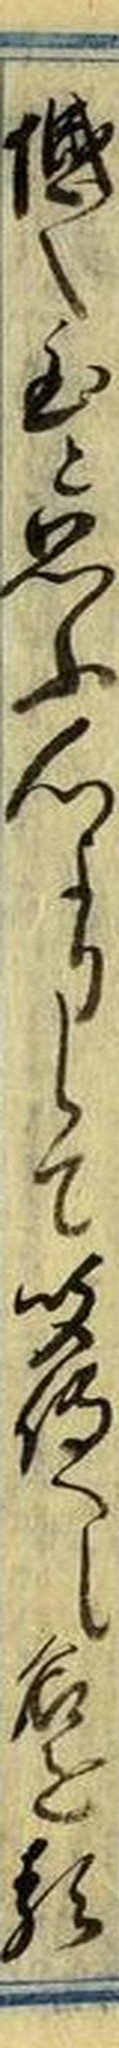憾之至と思ふ心よりして聞伝へし名を類
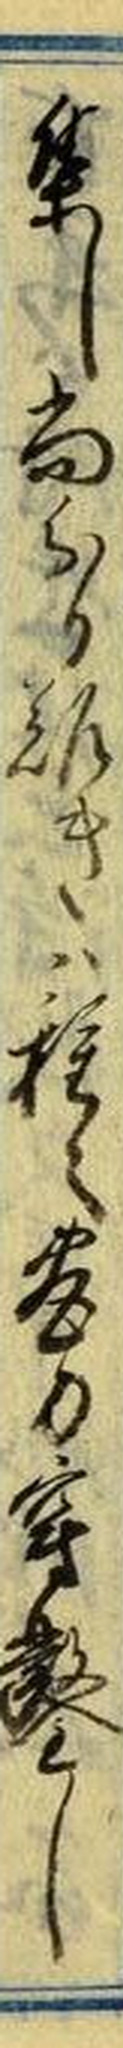集し尚分り難きは種々究力穿鑿し
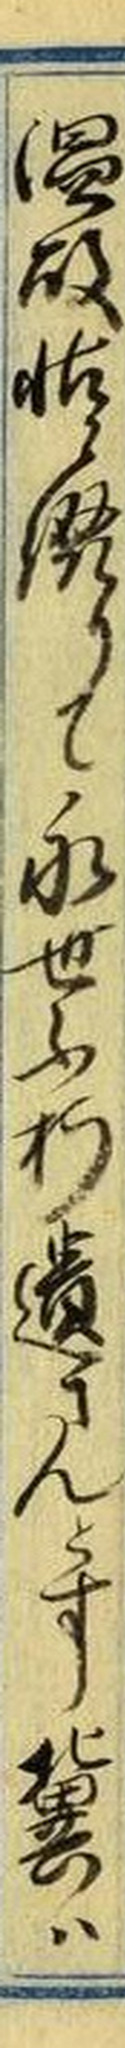温故帖に綴りて永世不朽遺さんとす冀は
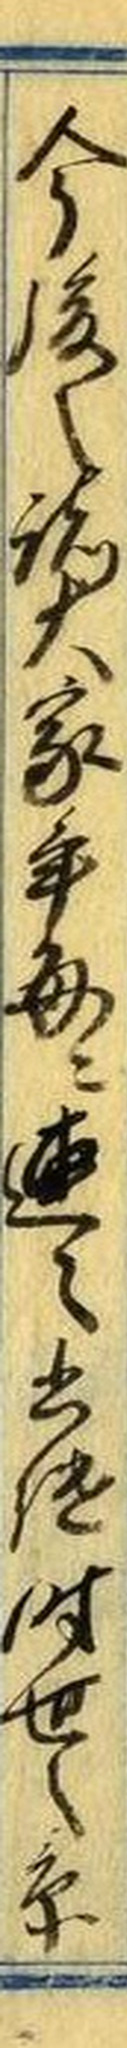今後之諸大家年毎に連々書継時世之景
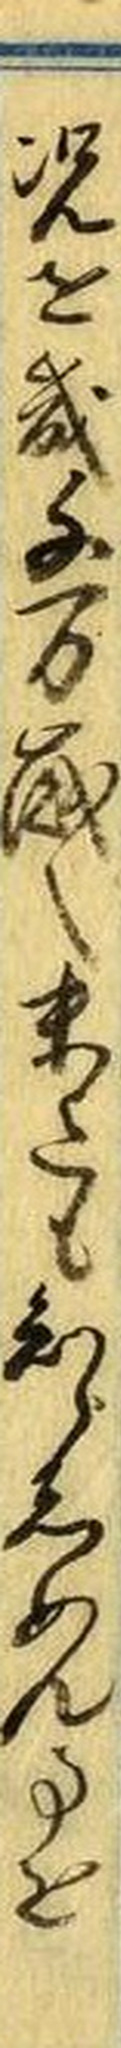況を幾千万歳之末迄も知らしめん事を
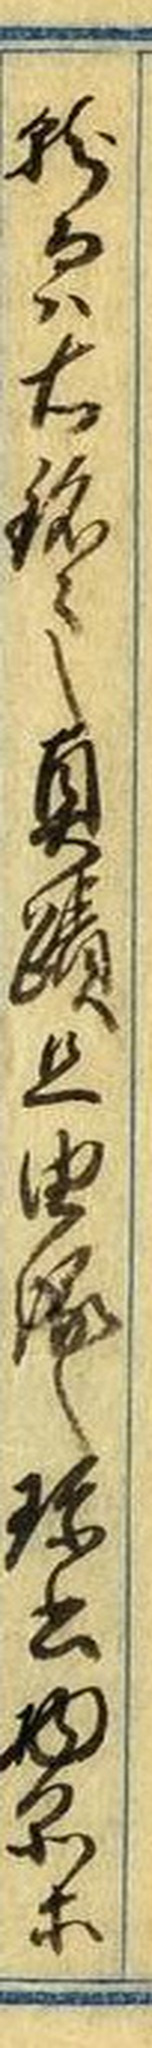就而は右銘々之真蹟且由縁之珍書物品等
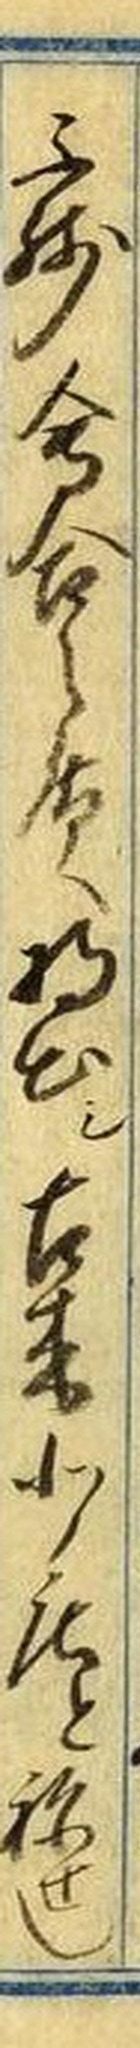不残会合し広く持出し古来北ノ庄と称せし
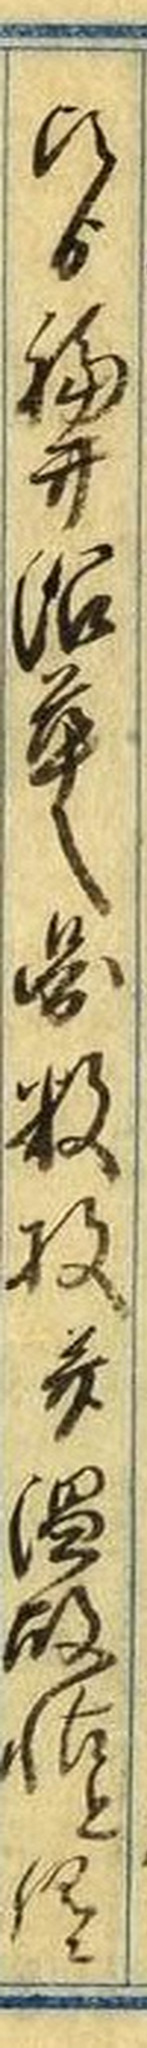比ゟ福井沿革之図数枚并温故帖と俱に
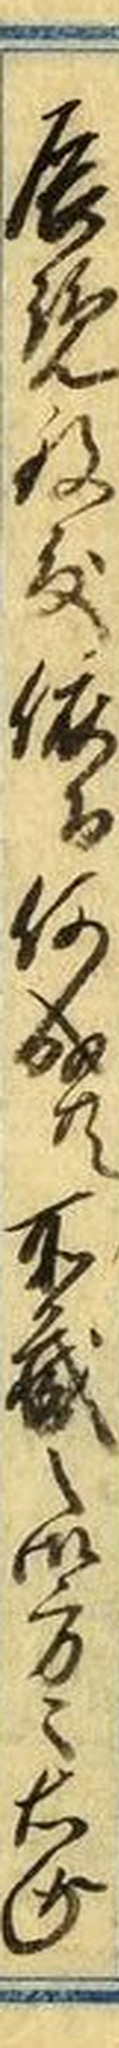展覧致度依而何成共所蔵之御方々右趣
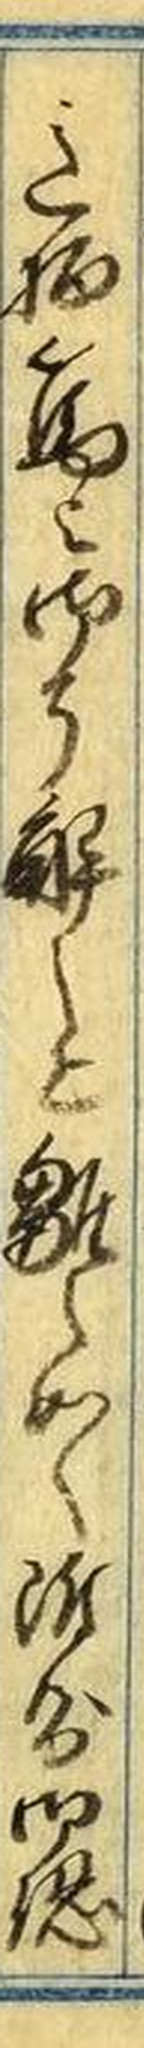意柄篤と御了解之上雛之如く附図御認
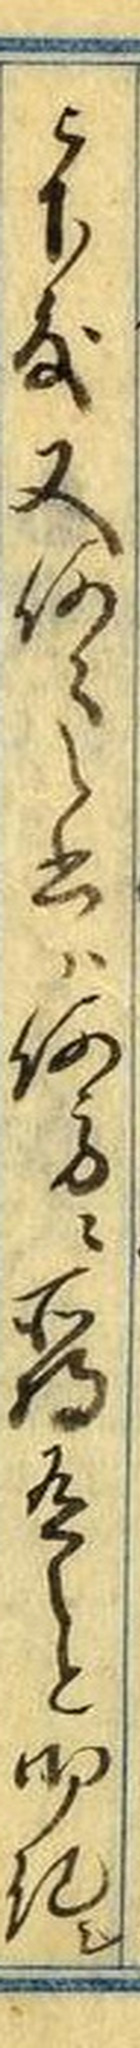被下度又何々之書は何方に所持有しと御記し
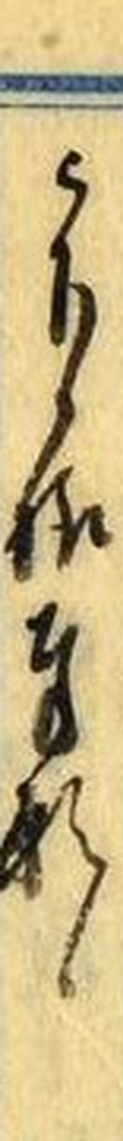被下候様奉願候

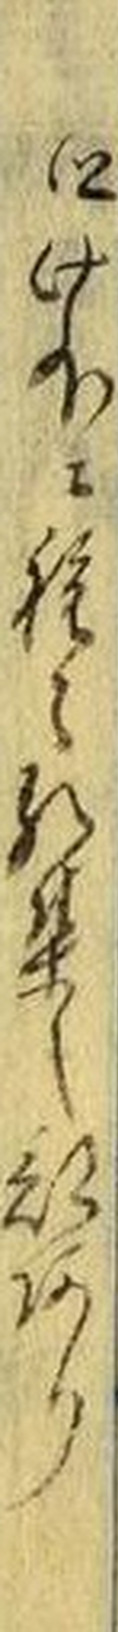但此外に種々類集之部あり
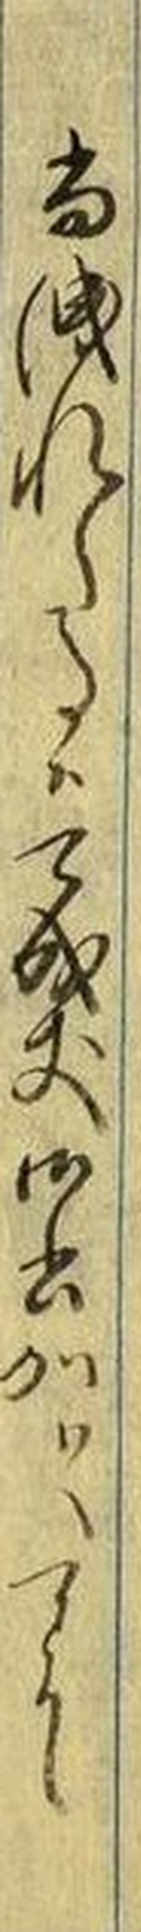尚洩たるは可成丈御書加わへ可被下候
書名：温古集 四巻
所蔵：福井県文書館 Fukui Prefectural Archives
